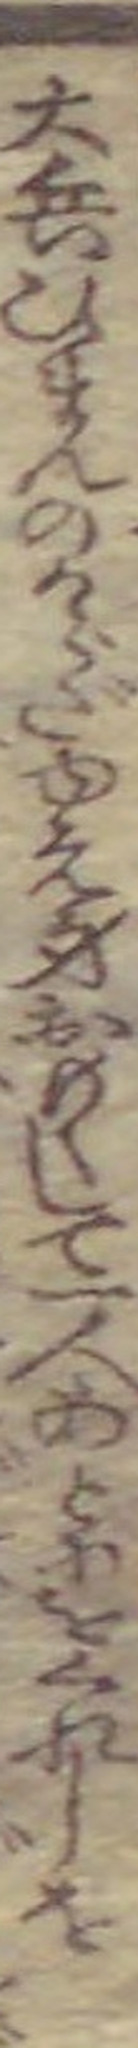大兵ひまんのからだゆえ身おもくして一人あとにをくれしを
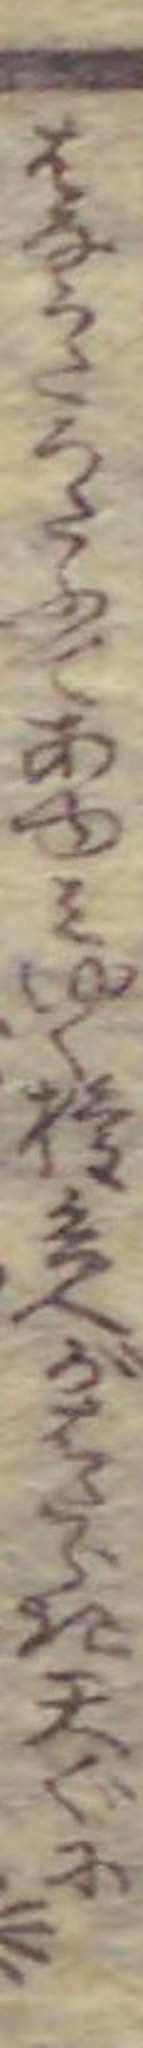はなうたうたふてあゆみゆく権兵へがはたらき天ぐに
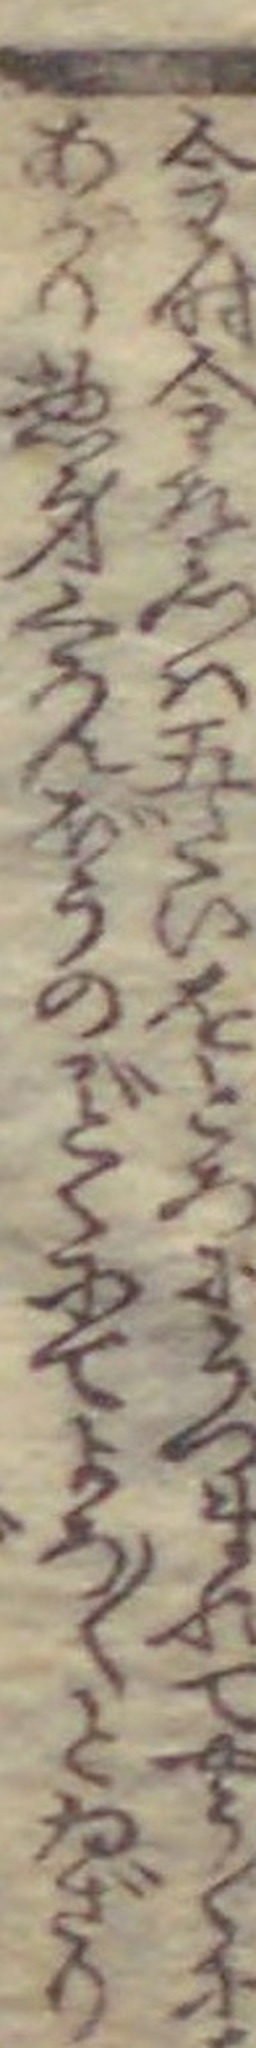あがり惣身くろんぼうのごとくにてよろ〳〵とゐざり
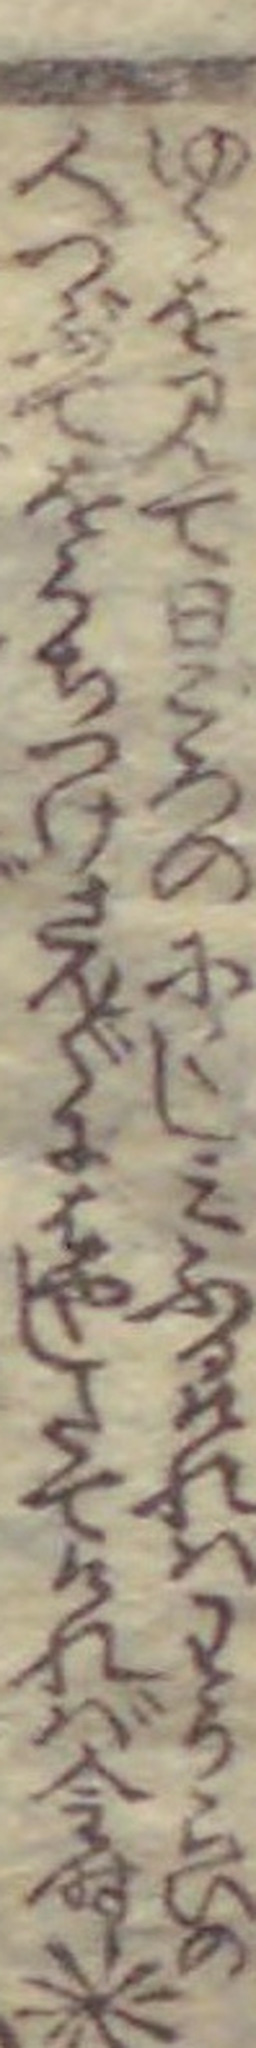人つぶてをうちつけさん〴〵にはやしたてければ金時
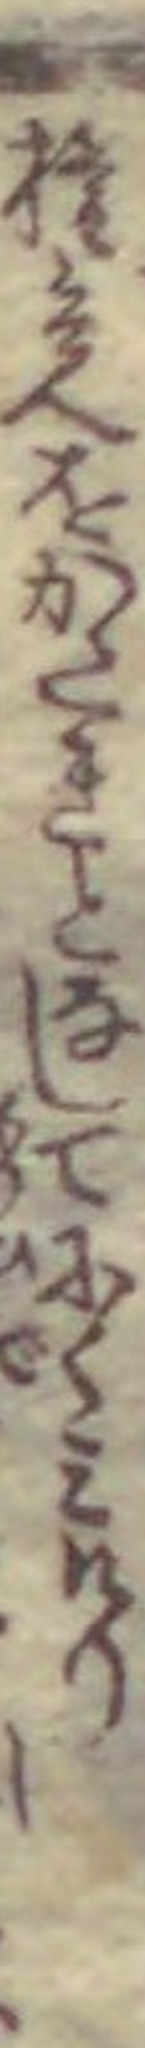権兵へをかたきとなしてにくみけり
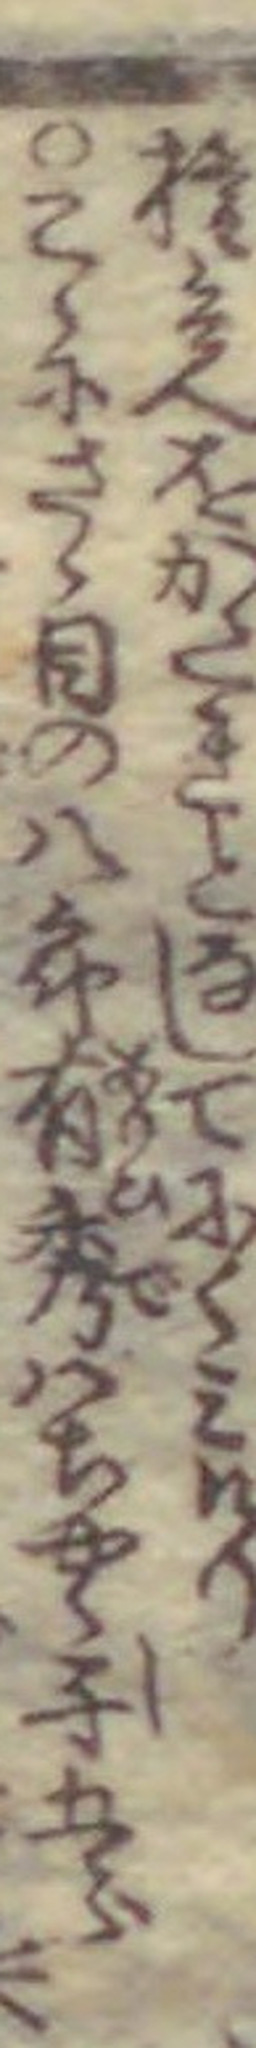○こゝにさゝ目の八郎有秀はちやく子五郎
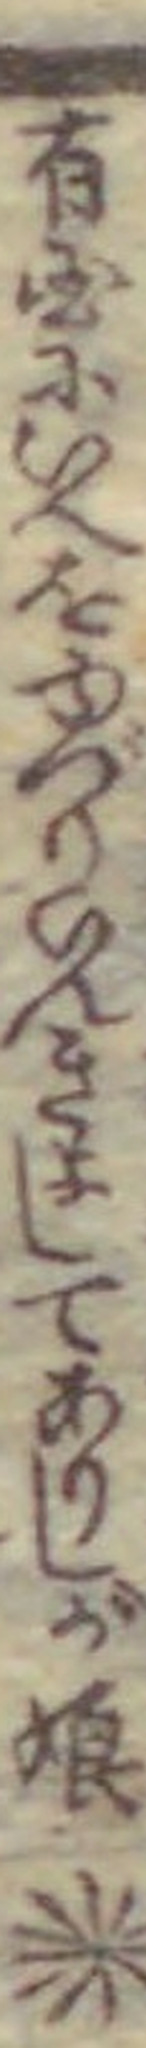有国にいへをゆづりいんきよしてありしが娘
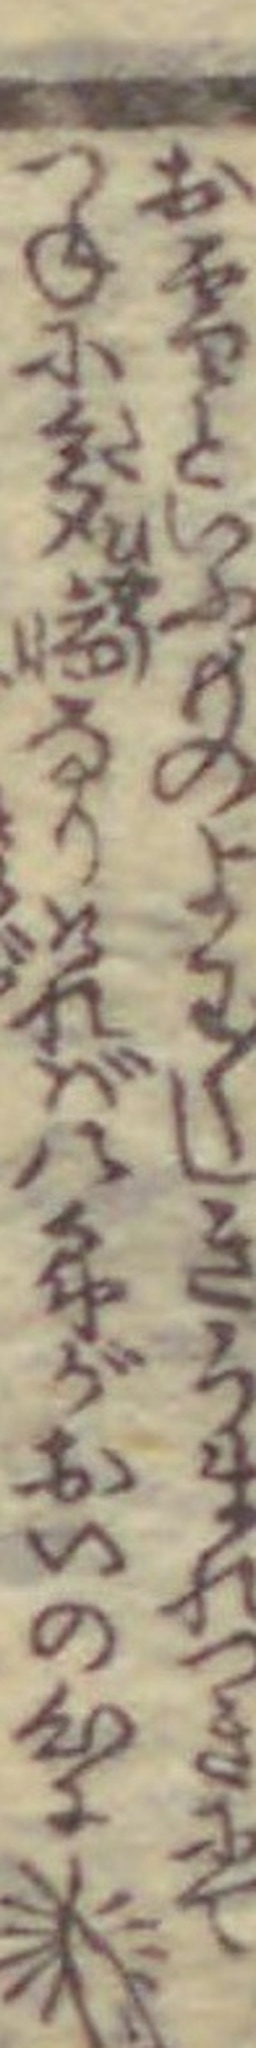つねに多病なりければ八郎がおいの心に
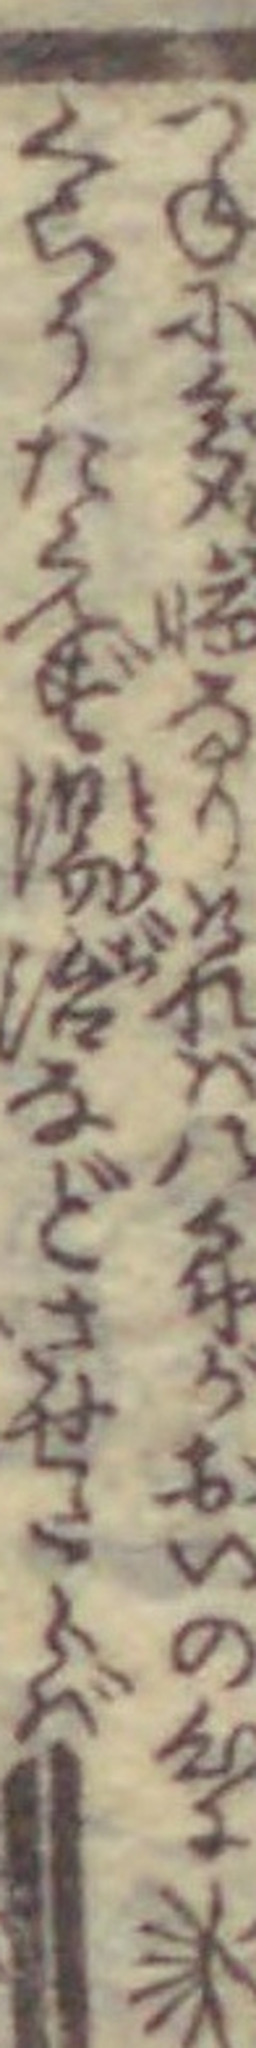くらうたえず湯治などさせたらば
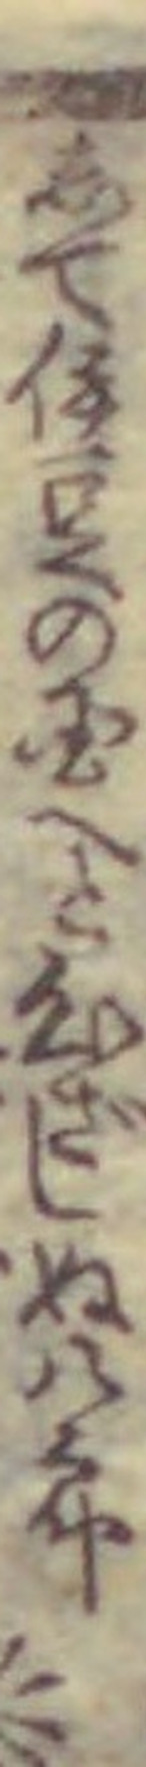して伊豆の国へと心ざしぬ八郎
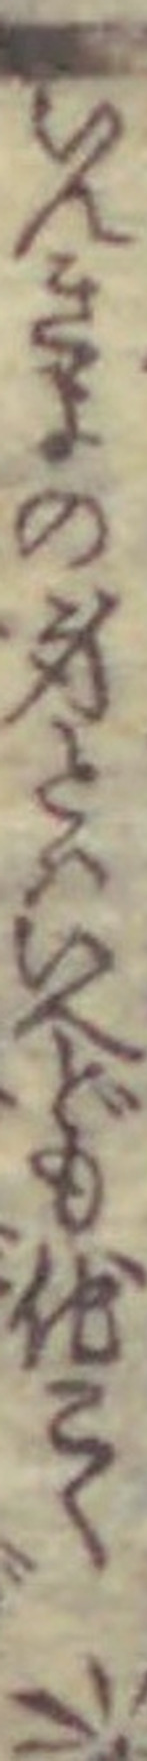いんきよの身とはいへども他こく
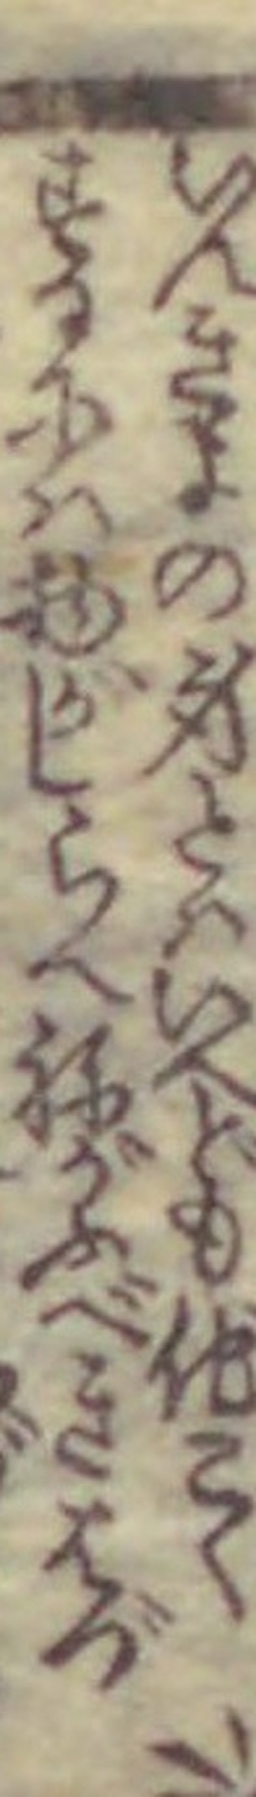するには物がしらへねがふべきはづ
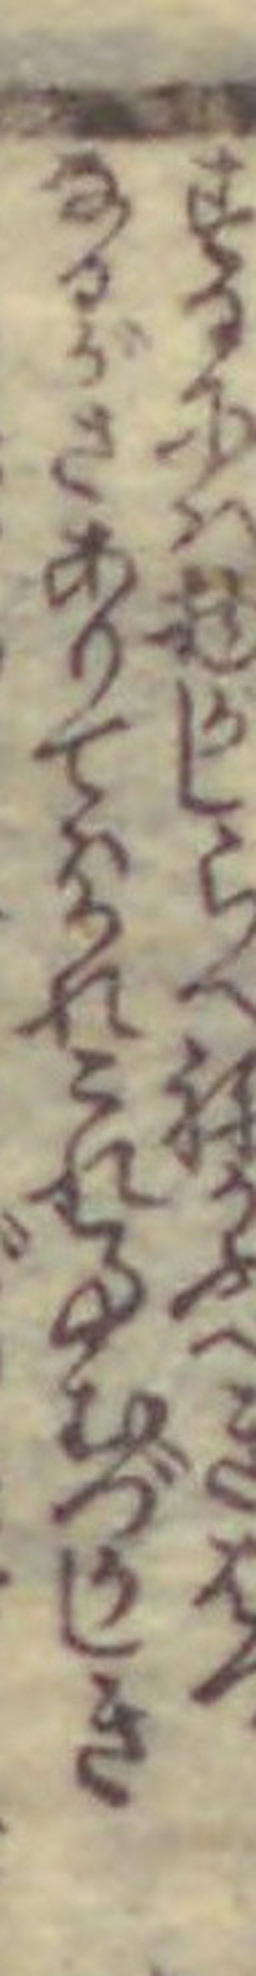なるがさありてはかれこれ事むづかしき
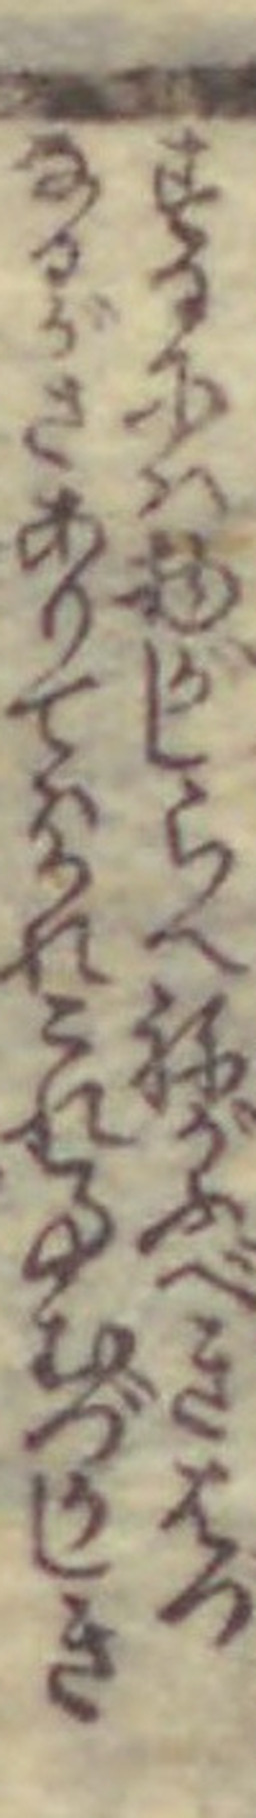なるがさありてはかれこれ事むづかしき
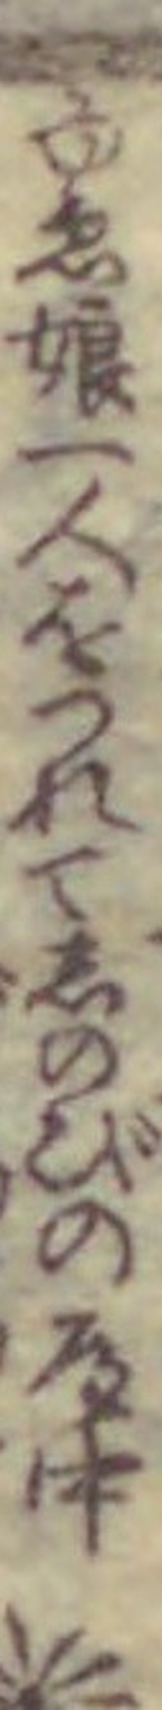ゆゑ娘一人をつれてしのびの道中
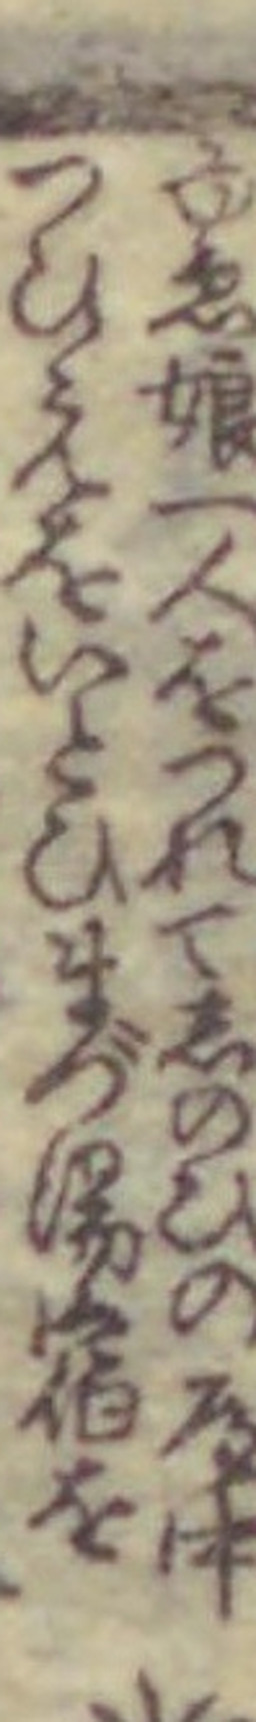つひえをいとひまづ湯宿を
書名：八ツ目鱣因縁物語 3巻
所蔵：国立国会図書館 National Diet Library, JAPAN
